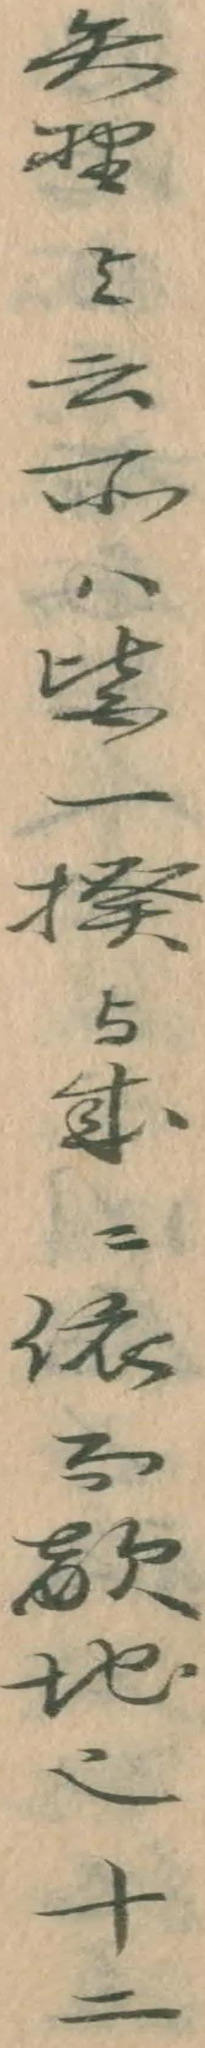矢野と云所は皆一揆と成に依而敵地也十二

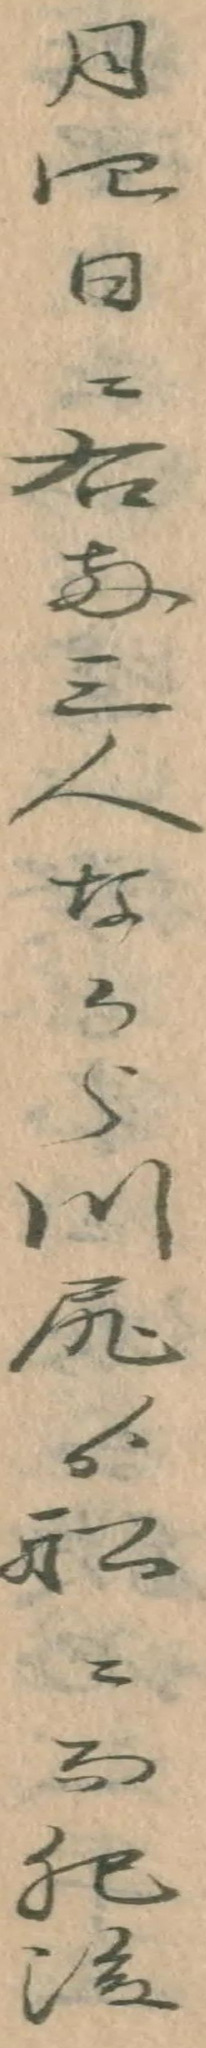月四日に右両三人なから川尻ゟ船に而肥後
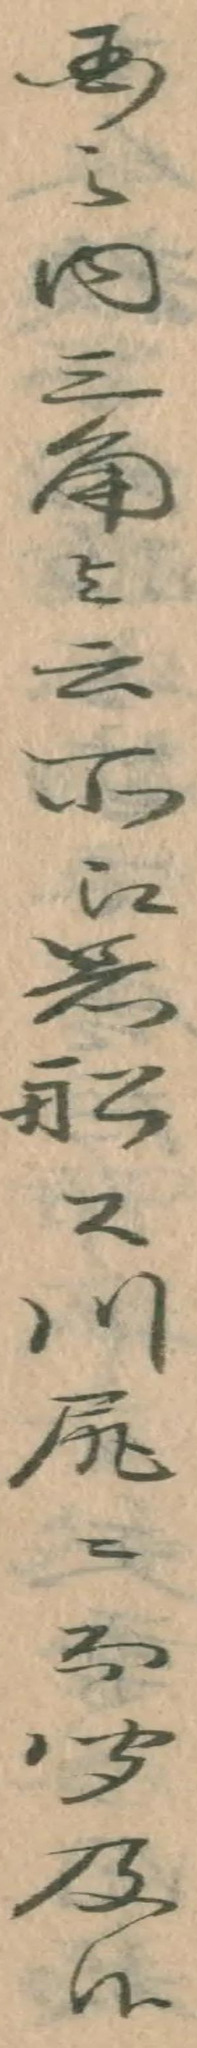国之内三角と云所江着船す川尻に而聞及候
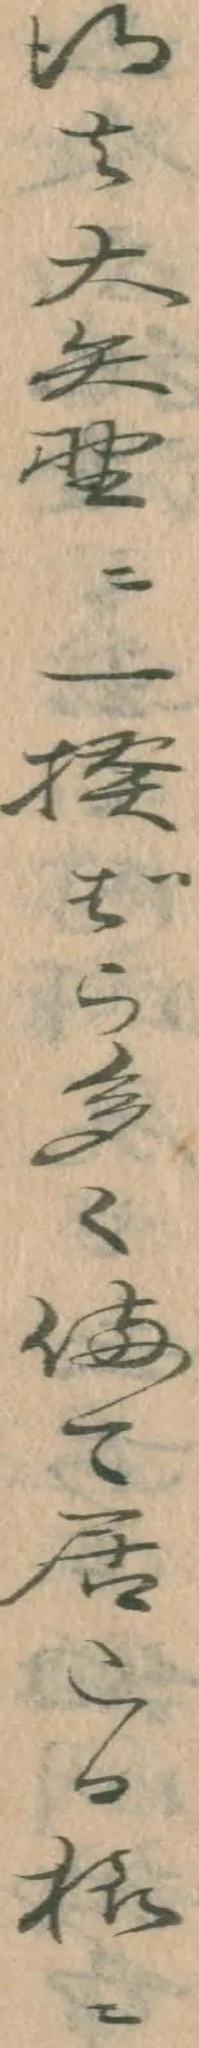得者大矢野に一揆ばら多く備て居たる様に
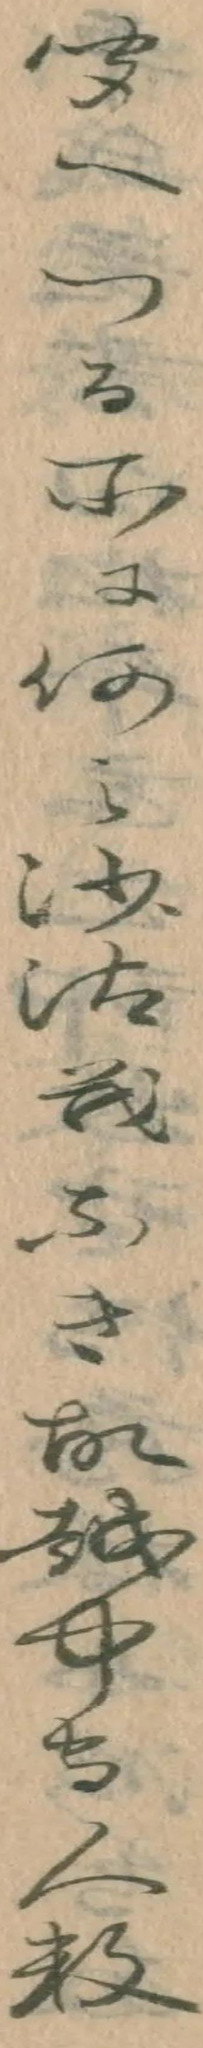聞へつる所に何之沙汰もなき故越中守人数
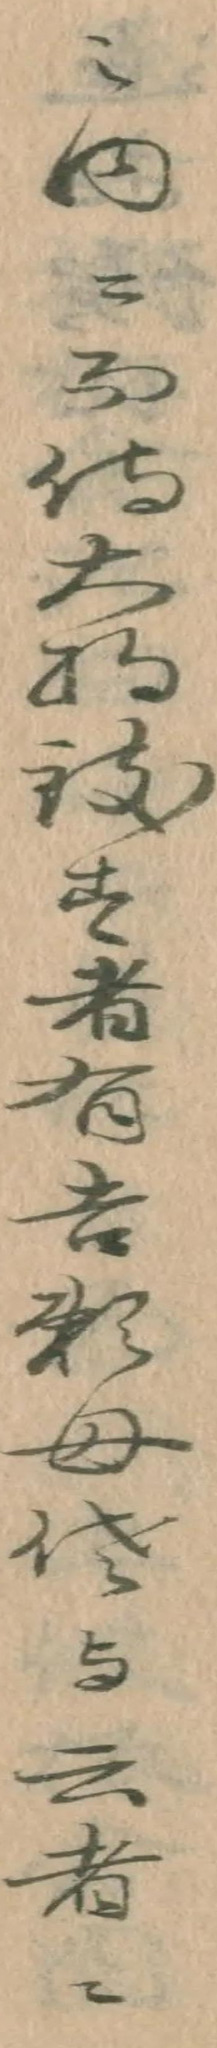之内に而侍大将致す者有吉頼母佐と云者に
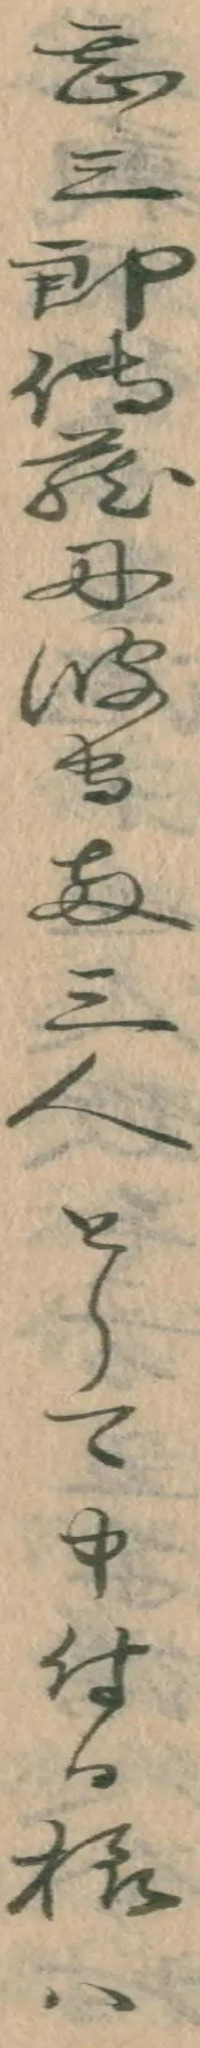甚三郎伝蔵丹波守両三人として申付る様は
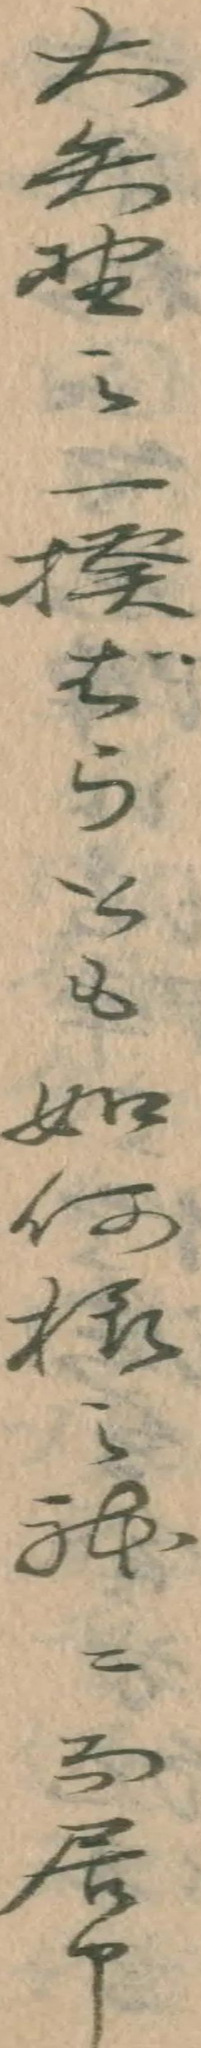大矢野之一揆ばらとも如何様之体に而居申
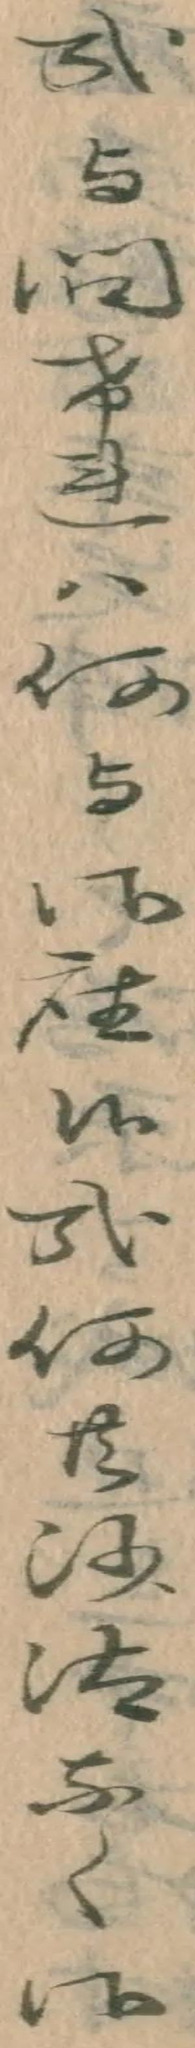哉と問けれは何と御座候哉何共沙汰なく御
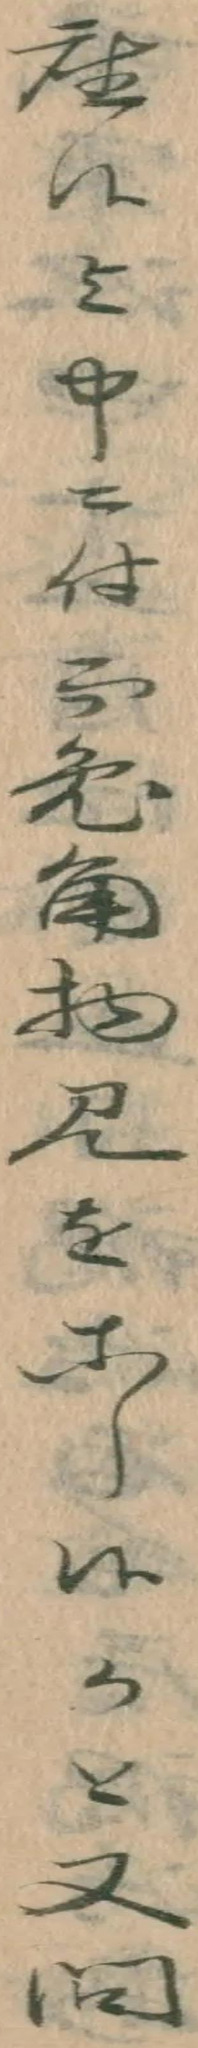座候と申に付而兎角物見をこし候かと又問
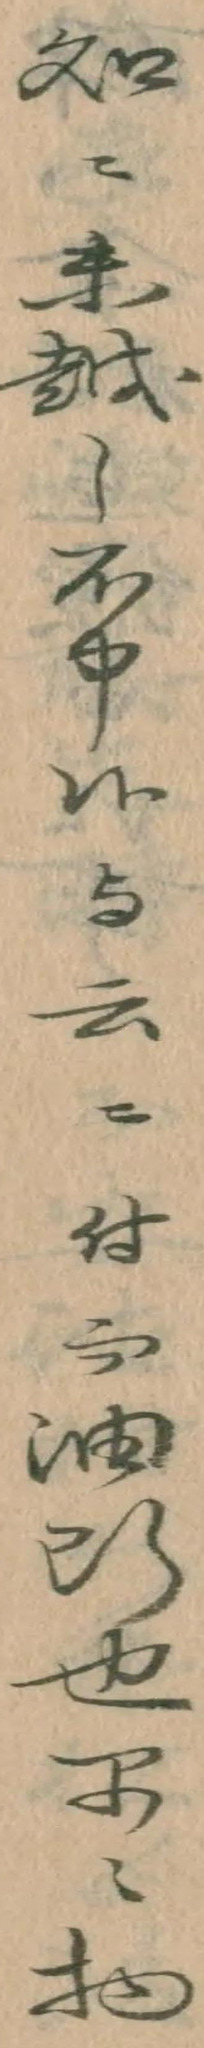処に未越し不申候と云に付而油断也早々物
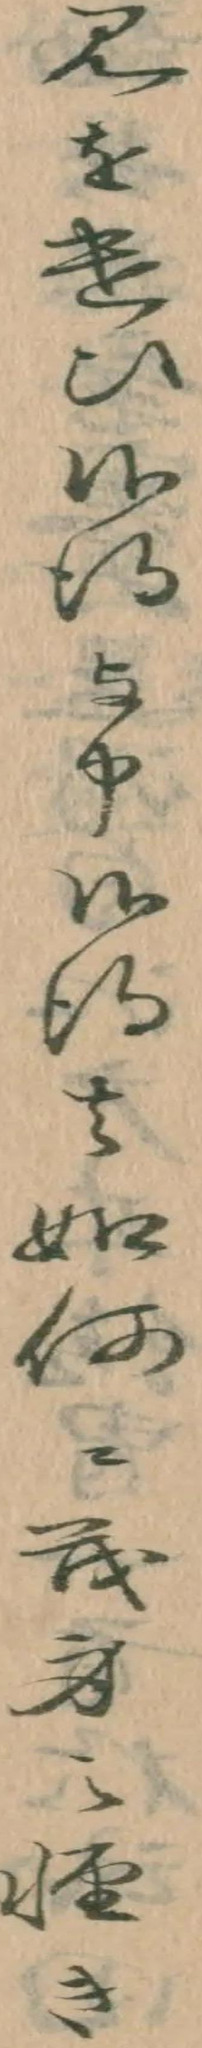見を遣ひ候得と申候得者如何にも身の軽き
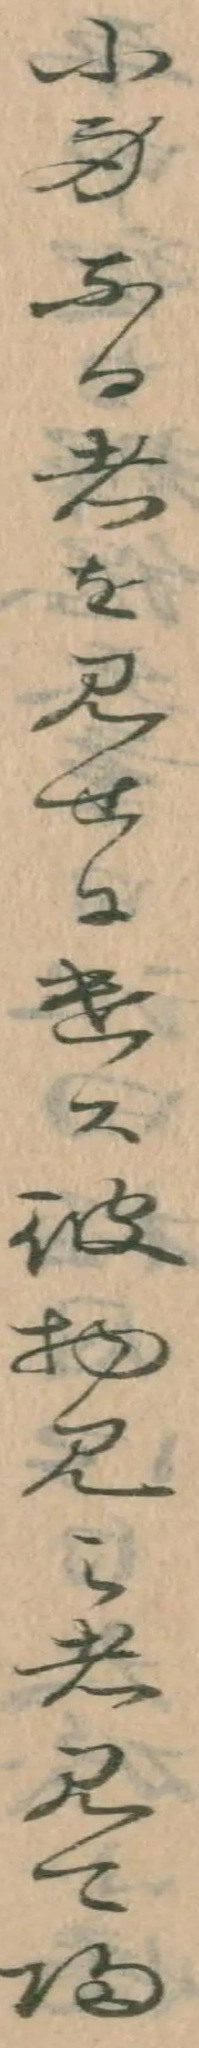小身なる者を見せに遣す彼物見之者見て帰
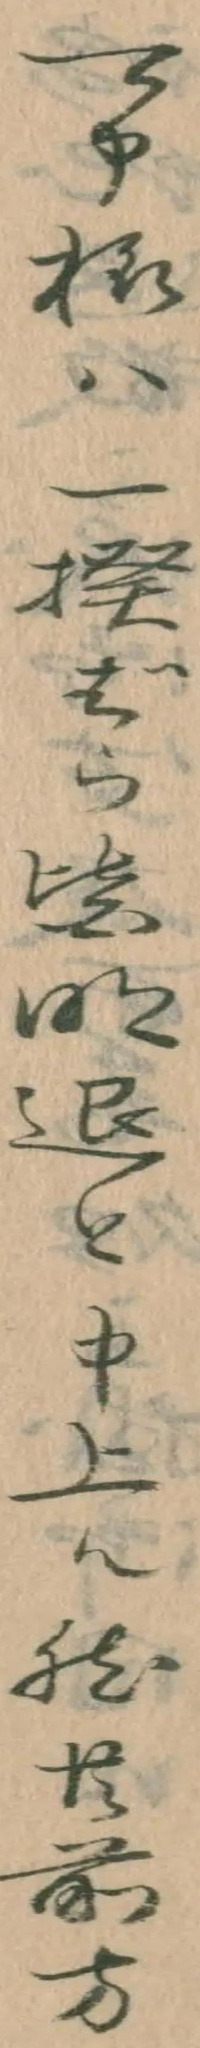可申様は一揆ばら皆明退と申上候然共前方
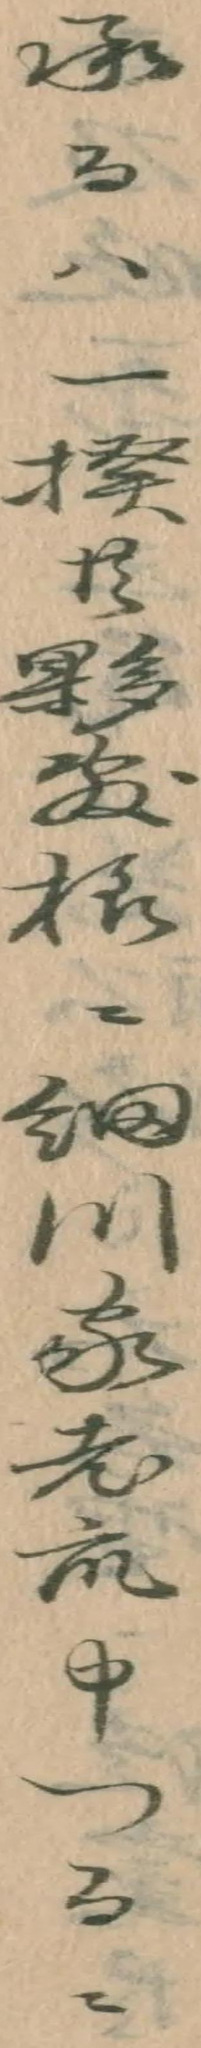承るは一揆共夥敷様に細川家老衆申つるに
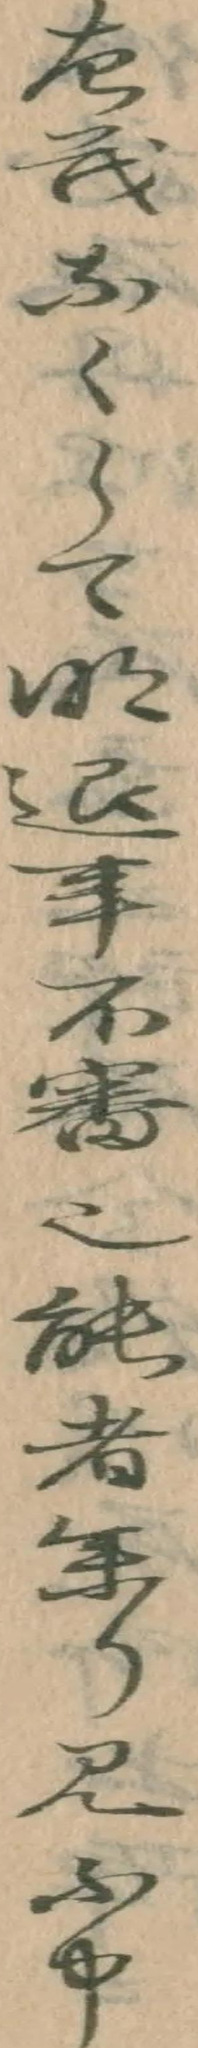左もなくして明退事不審也能者参り見不申
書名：切支丹御退治記 49巻. [3]
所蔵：国立国会図書館 National Diet Library, JAPAN
